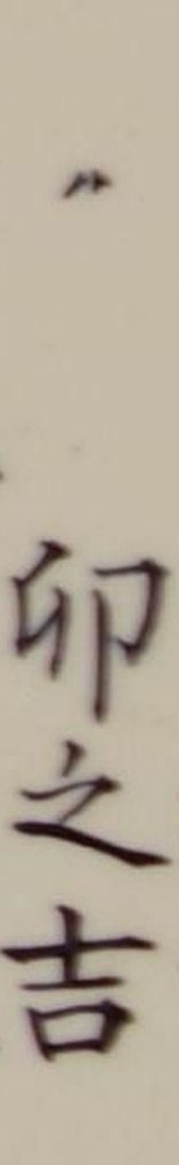卯之吉
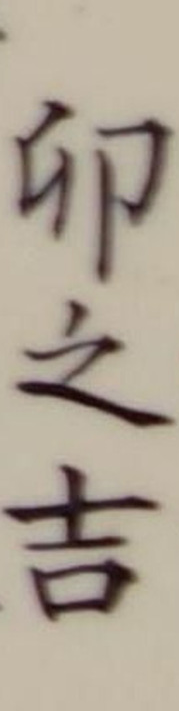卯之吉
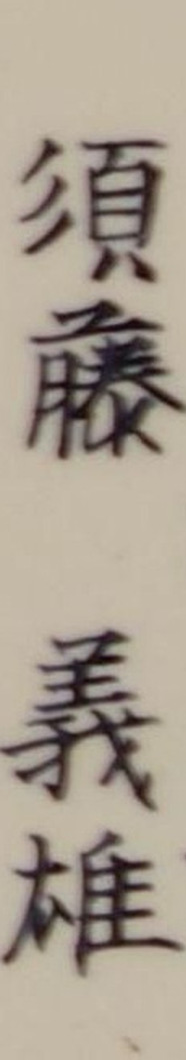須藤義雄
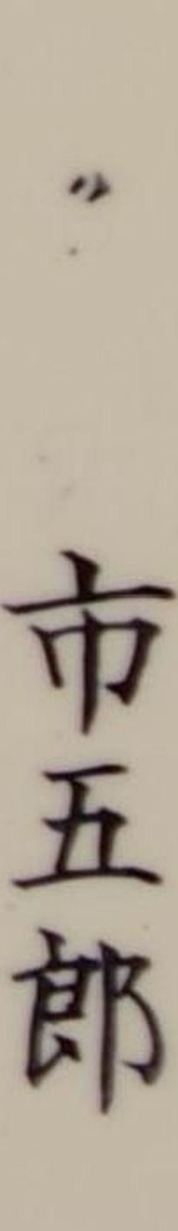市五郎
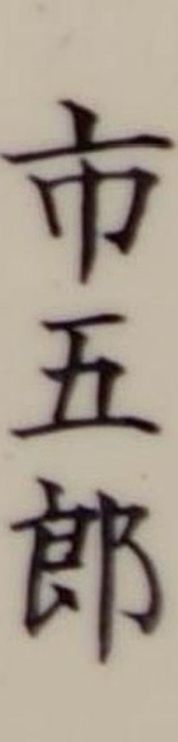市五郎
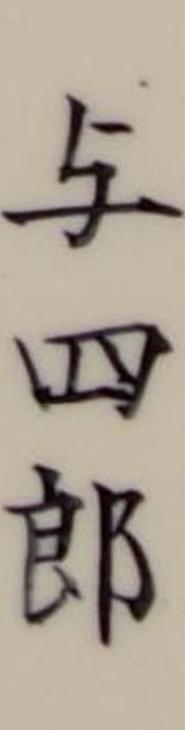与四郎
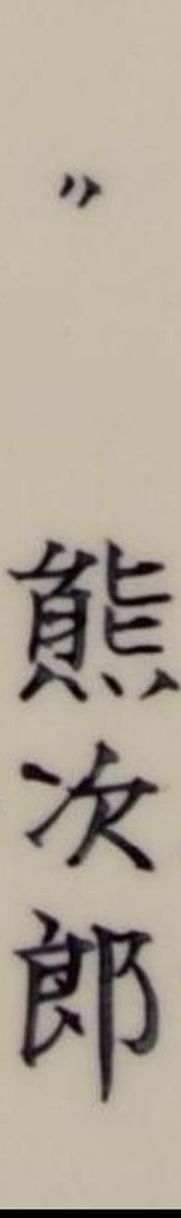熊次郎
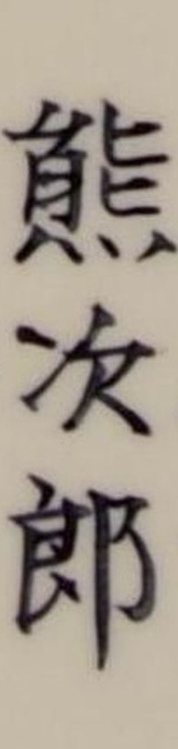熊次郎
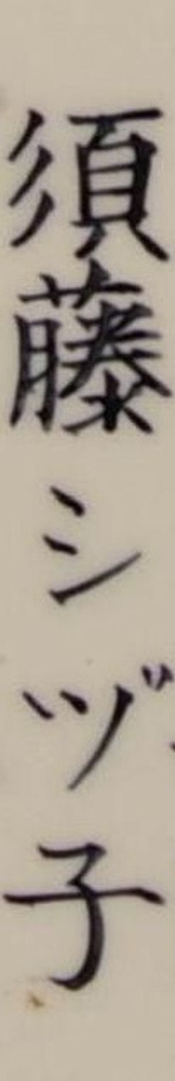須藤シヅ子
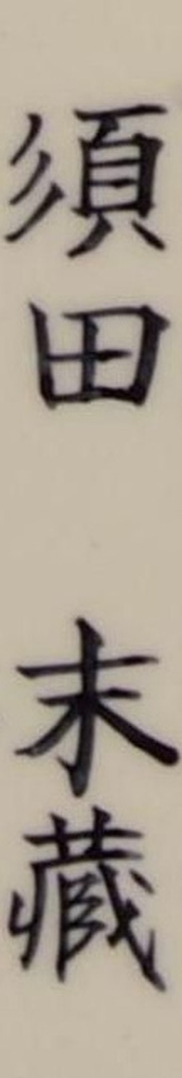須田末蔵
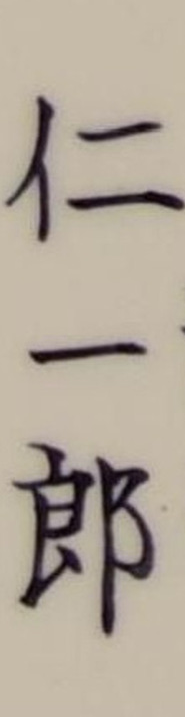仁一郎
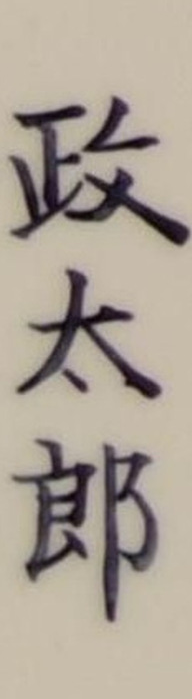政太郎
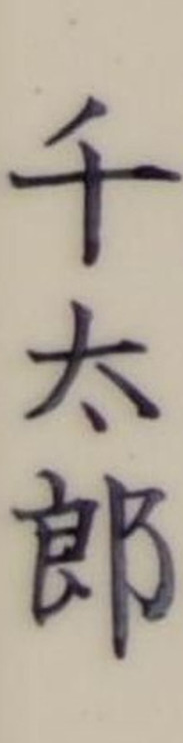千太郎

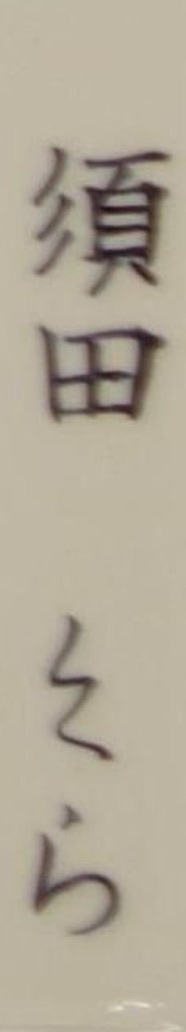須田くら
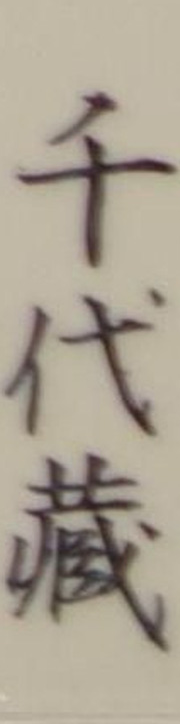千代蔵
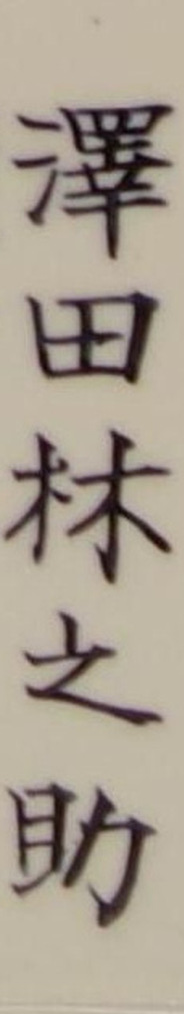澤田林之助
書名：M~S
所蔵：高野山金剛峯寺
